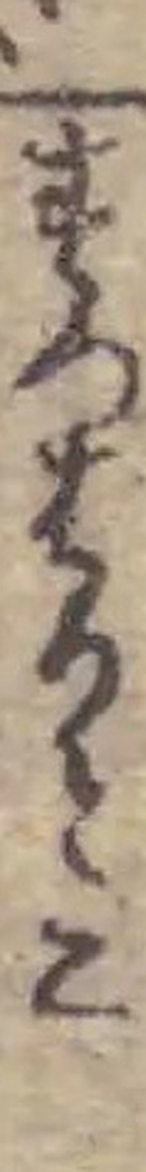すつはりとこ
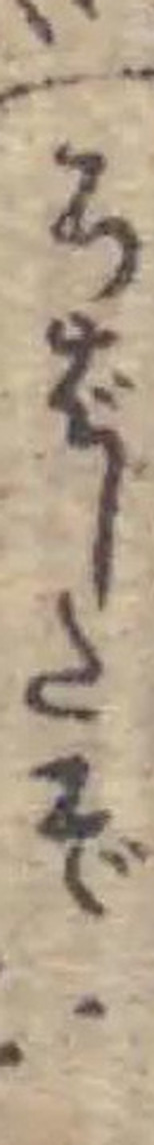ろばしたぞ
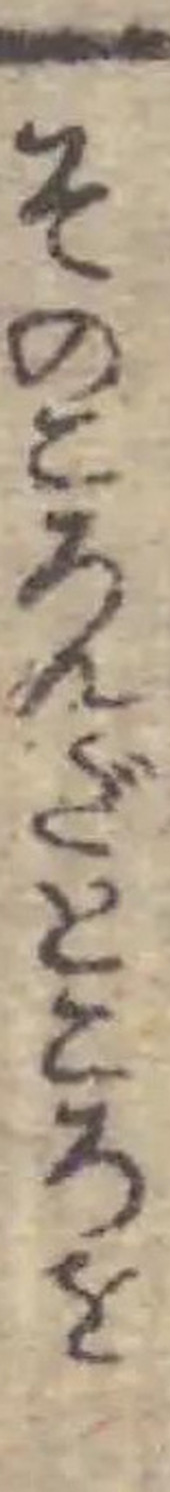そのころんだところを
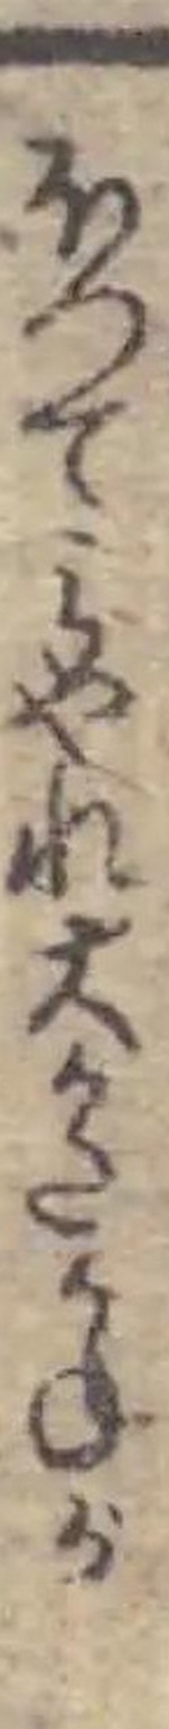ほつてみやれ大かたかねが
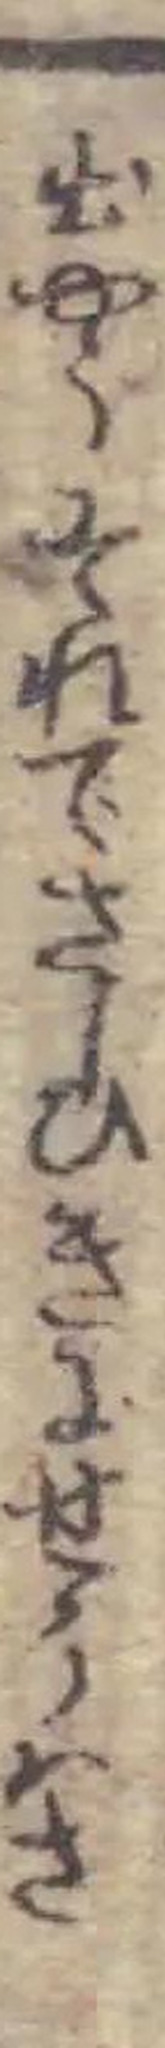出やうそれでさしひきにせうはさ
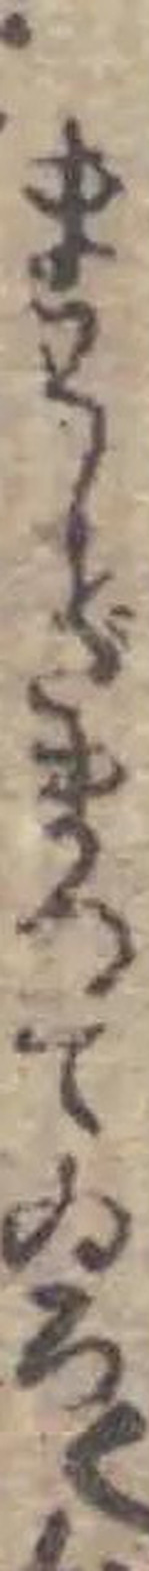まわしだまつてゐろ
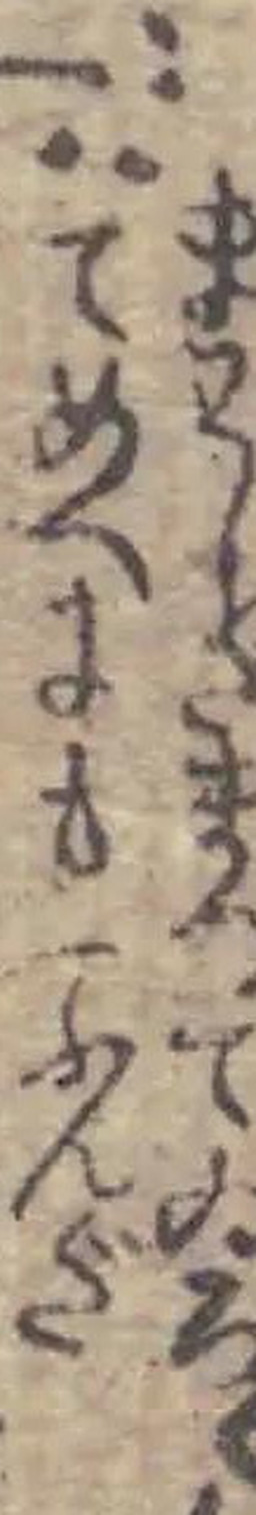てめへにも一ふんだぞ
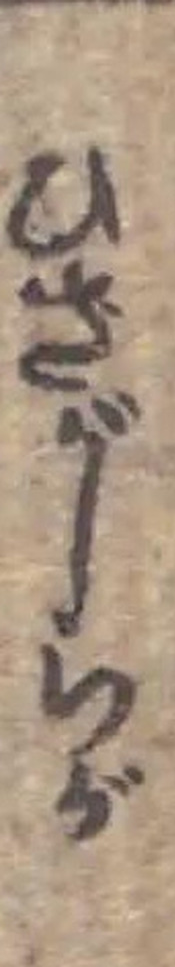ひさがしらが
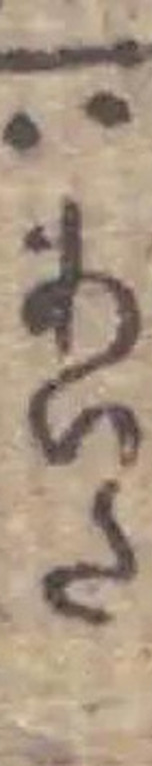あいた
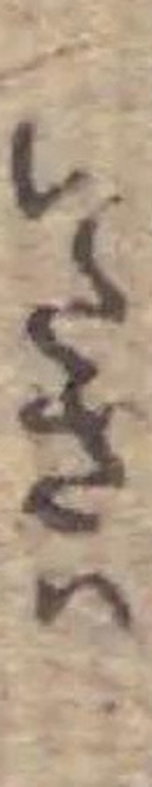いたさは
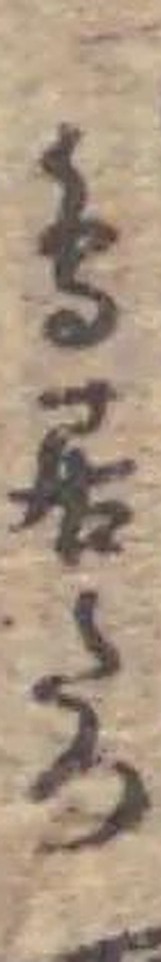鳥居たつ
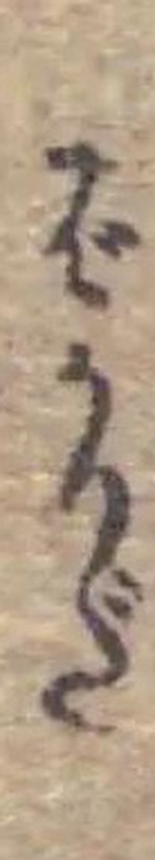ばかりだ
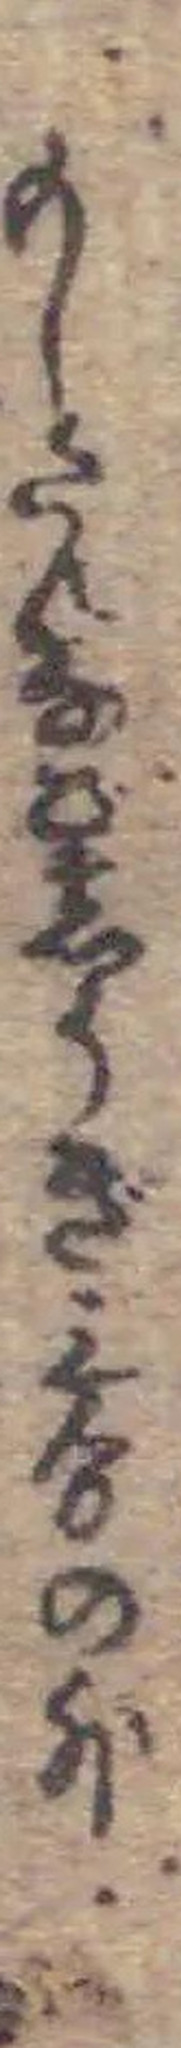もしたんな御しうぎ三分の外
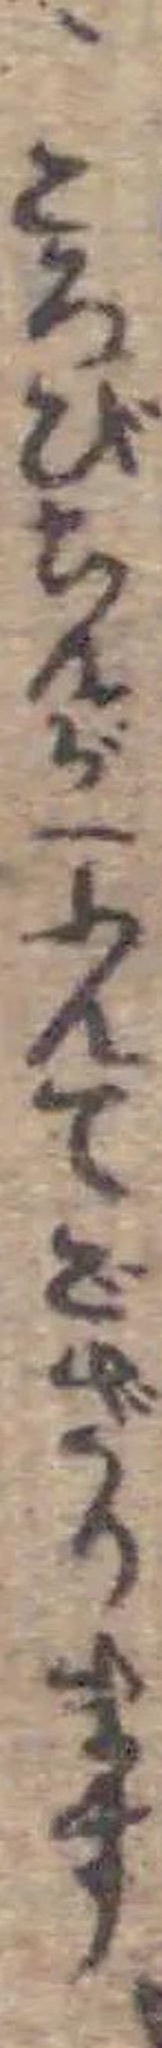ころびちんが一ふんでござります

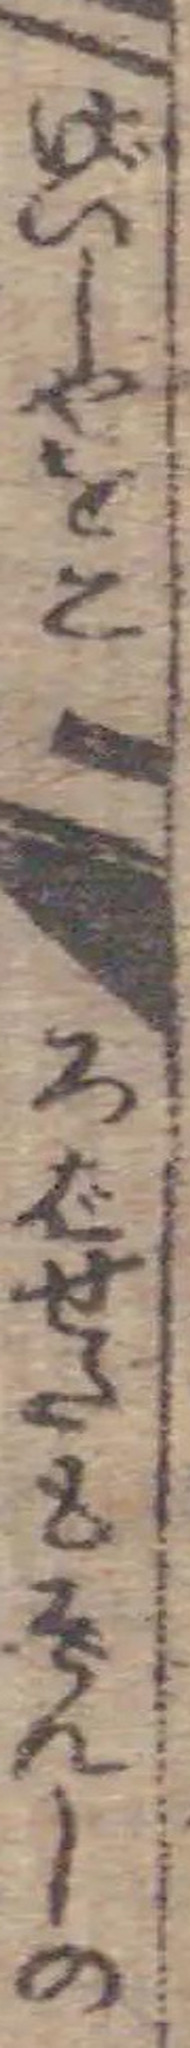げいしやをころばせたもそんしの
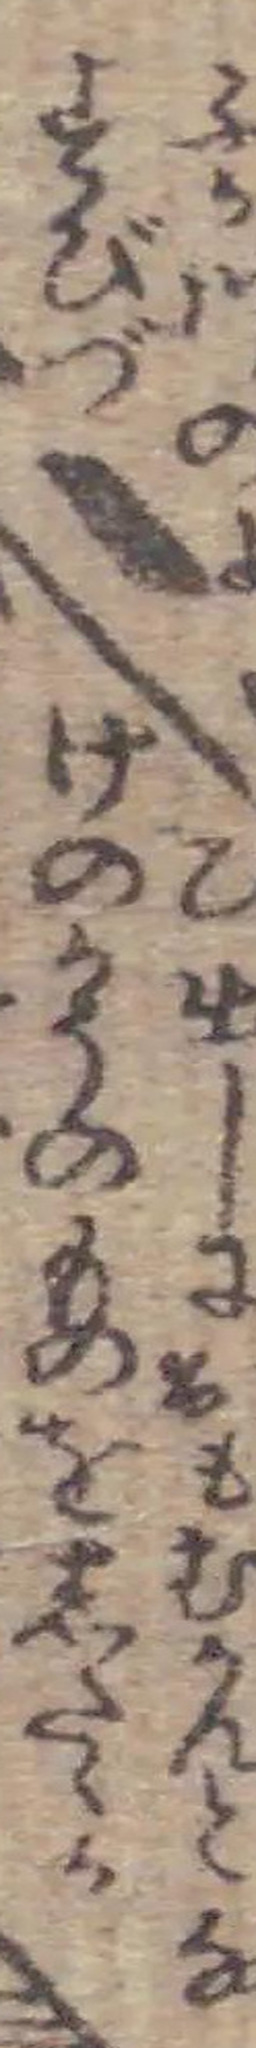すびづけのかうのものをしたゝか
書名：色男其処此処 3巻
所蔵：国立国会図書館 National Diet Library, JAPAN
